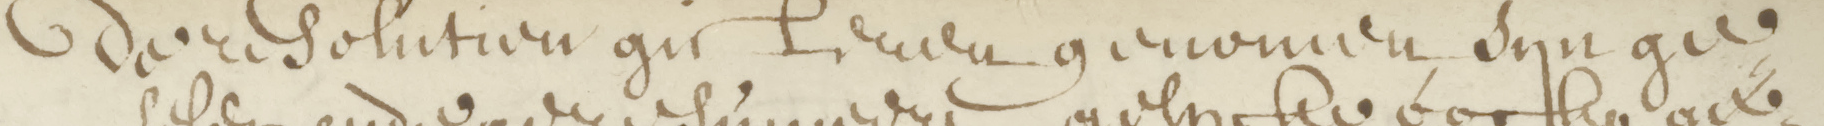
de resolutien gisteren genomen sijn ge„
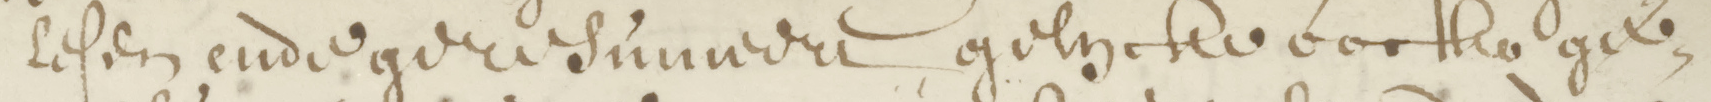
lesen ende geresumeert, gelijck oock ge„
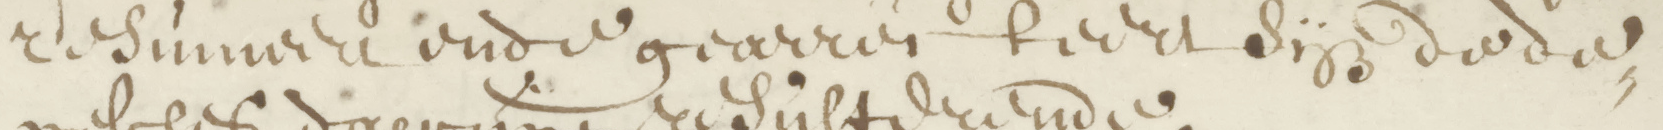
resumeert ende gearresteert sijnde de„
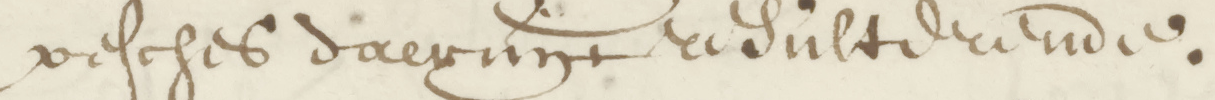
pesches daeruijt resulterende.
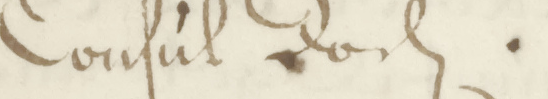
Consul Roch.
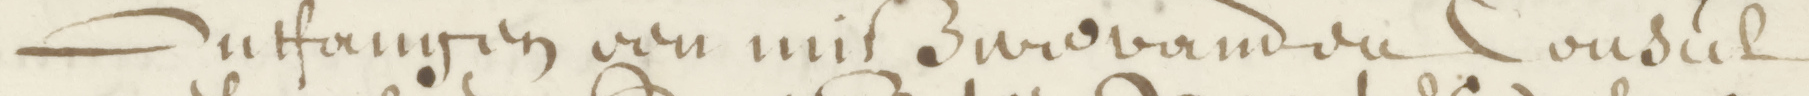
Ontfangen een missive vanden Consul
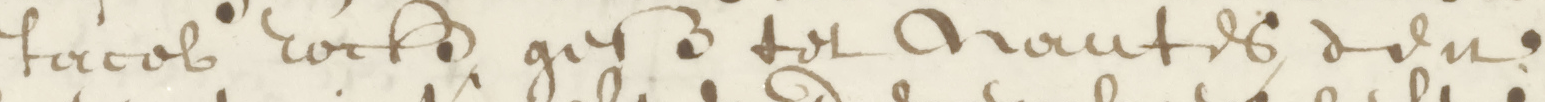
Jacob Roch ges tot nantes den
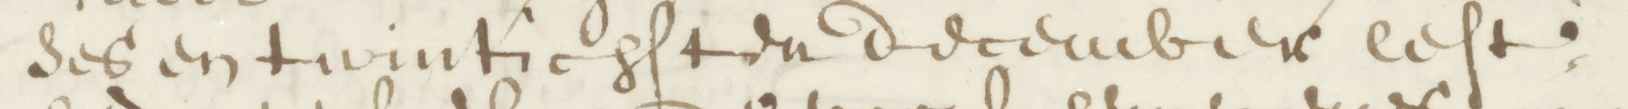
sesentwintichsten december lest„
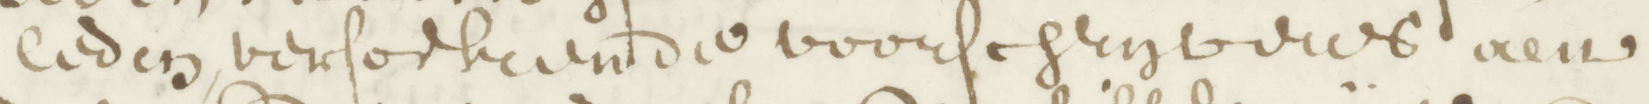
leden, versoekende voorschrijvens aen
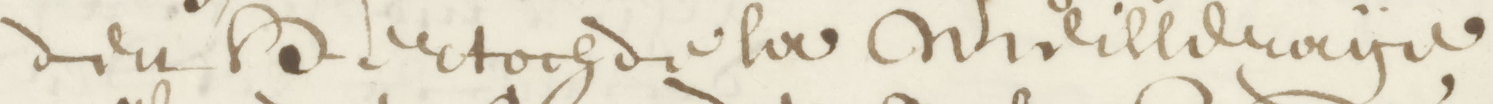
den Hertoch de la Meilleraije
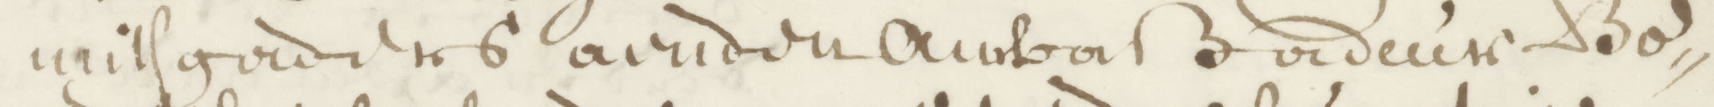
mitgaders aenden Ambassadeur Bo,,
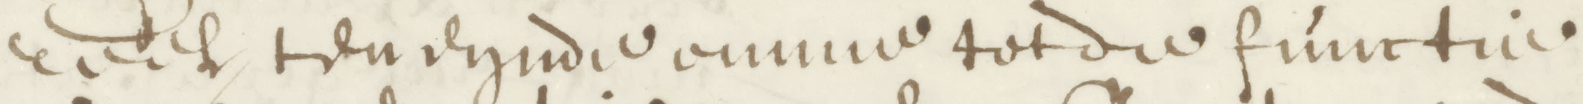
reel teneijnde omme tot de functie
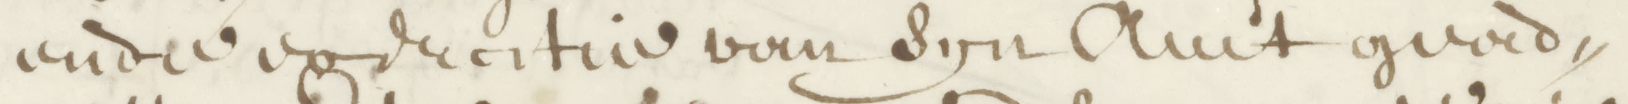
ende exercitie van sijn Amt gead„
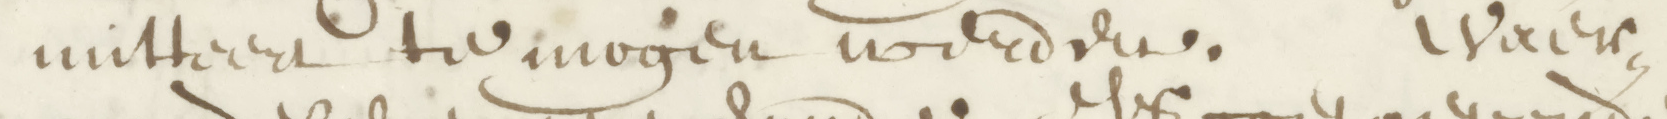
mitteert te mogen werden. Waer„
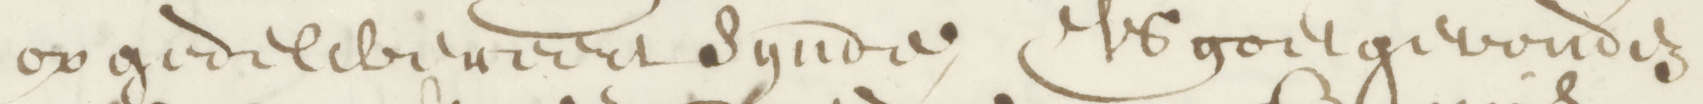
op gedelibereert sijnde, is goetgevonden
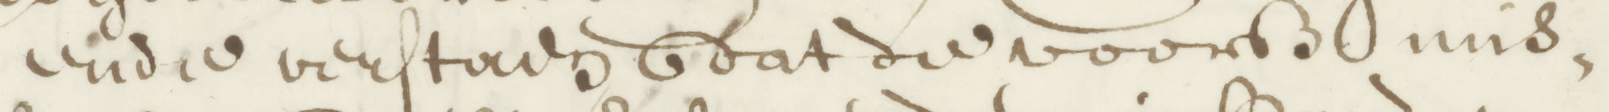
ende verstaen dat de voors mis„
